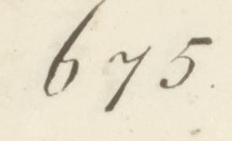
675
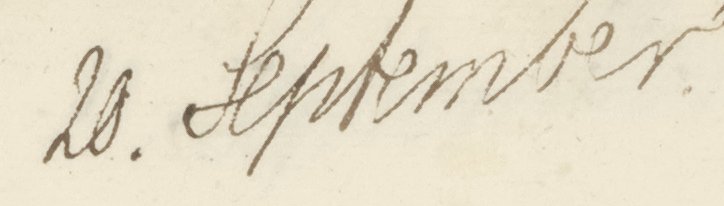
20. September.
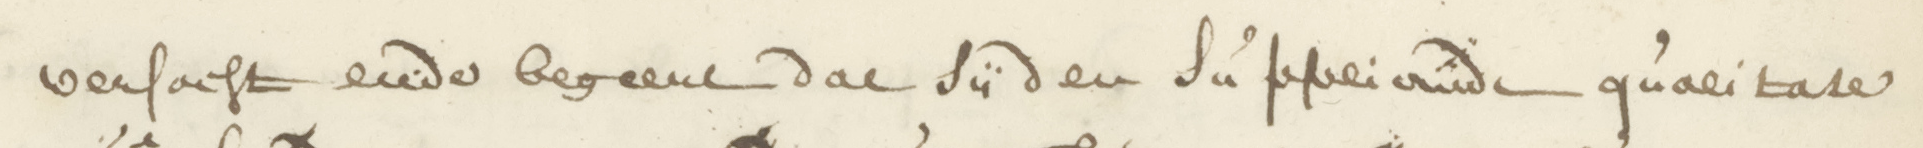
versocht ende begeert dat sij den suppliandt qualitate
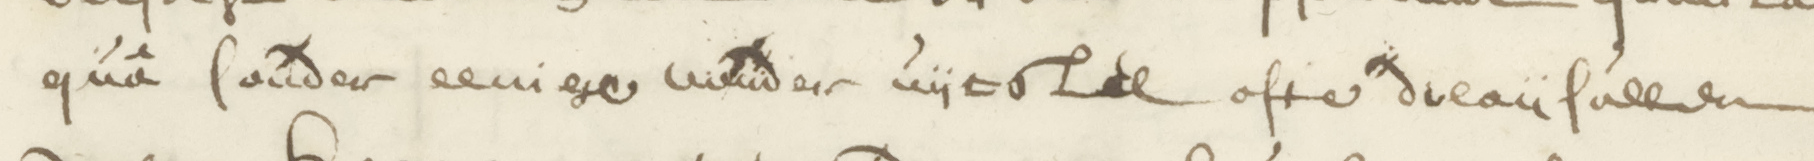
qua sonder eenigh verder uijtstsel ofte dilaij sullen
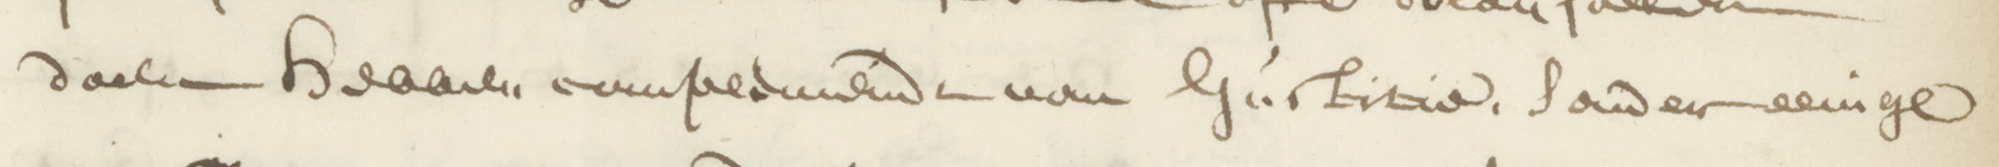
doen hebben complemendt van Justitie, sonder eenigh
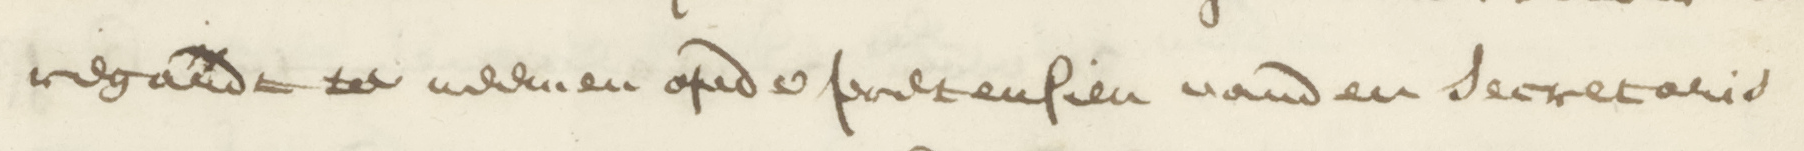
regardt te neemen opde pretensien vanden secretaris
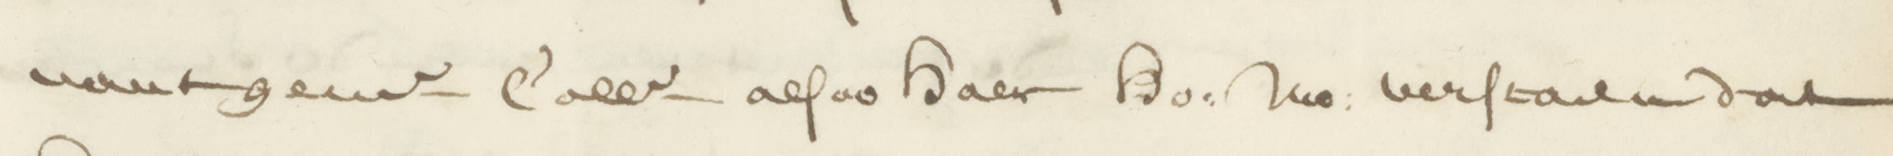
vant gene Colle alsoo haer Ho:Mo: verstaen dat
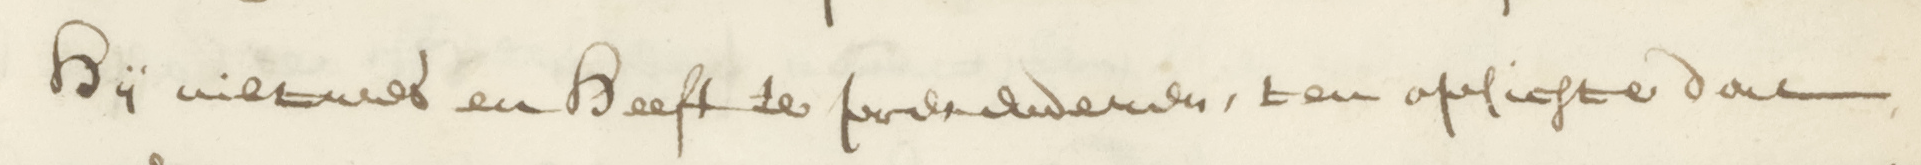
hij niet wes en heeft te pretenderen, ten opsichte dat
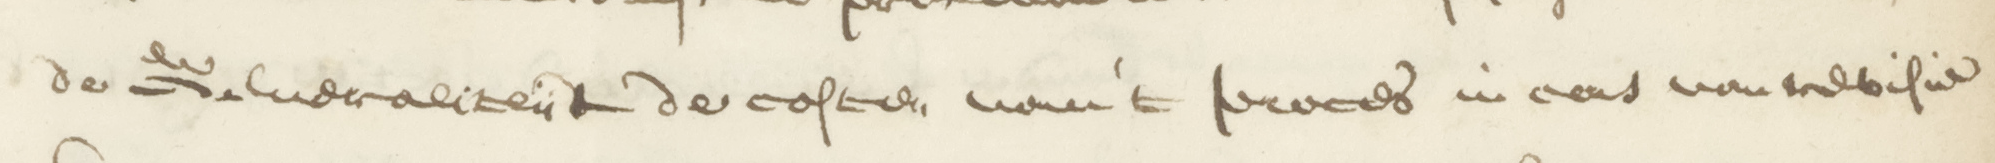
de Generaliteijt de costen van 't proces in cas van revisie
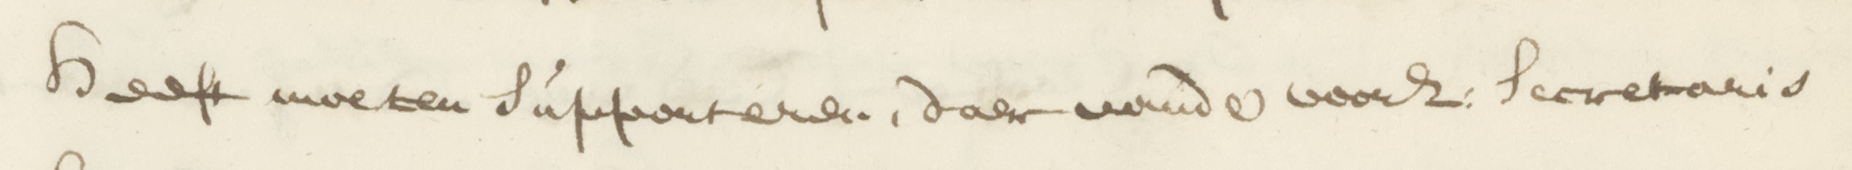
heeft moeten supporteren, daer vande voorz: secretaris
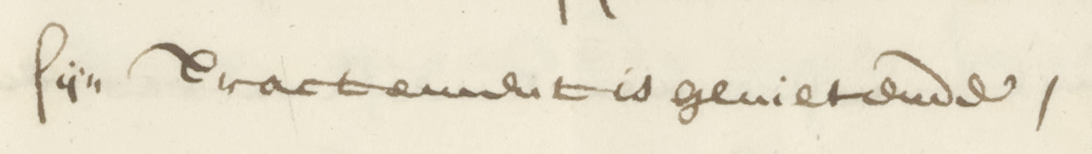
sijn tractement is genietende.
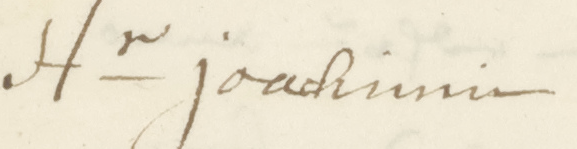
Hr. joachimi
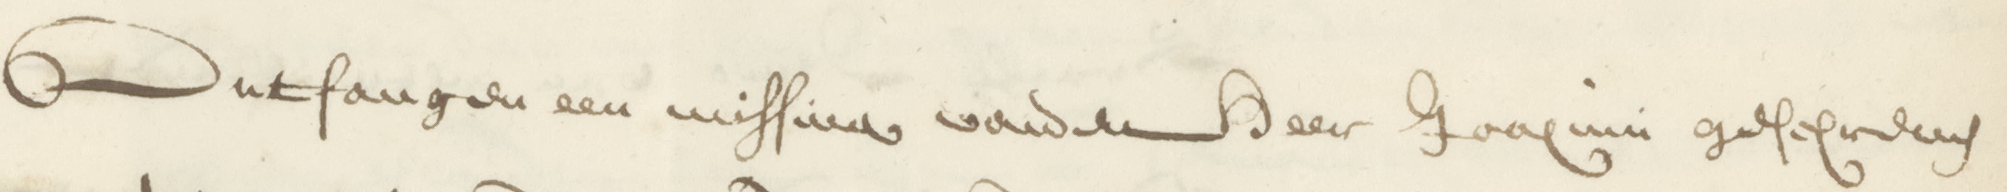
Ontfangen een missive vanden heer Joachimi geschreven
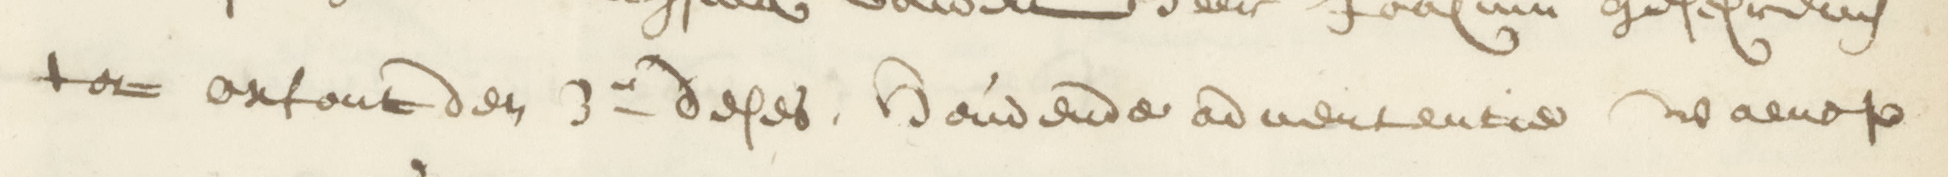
tot Oxfort den 3e deses, Houdende advertentie waerop
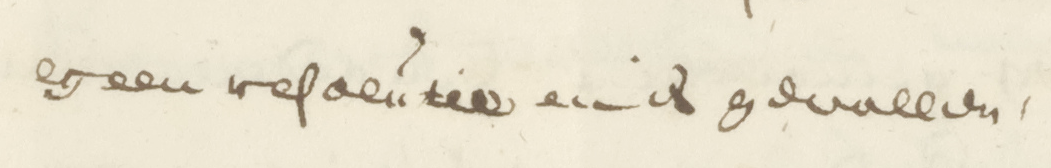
egeen resolutie en is gevallen.
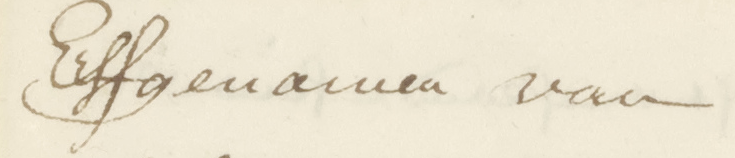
Erffgenamen van
